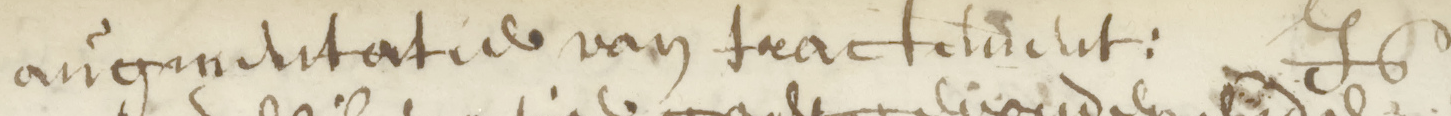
augmentatie van tractement: Is
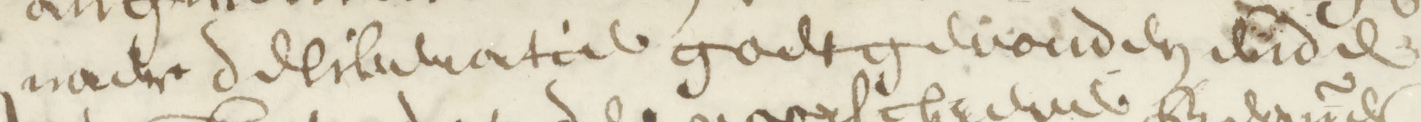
naer deliberatie goetgevonden ende
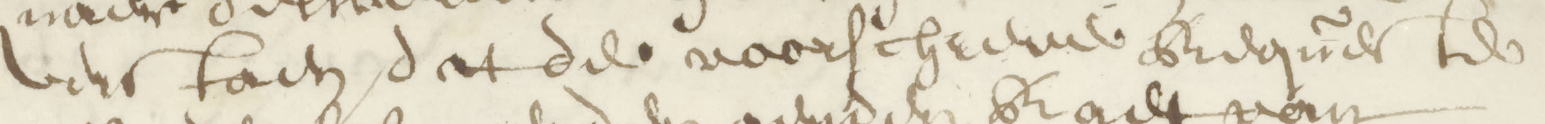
verstaen, dat de voorschreve Requeste
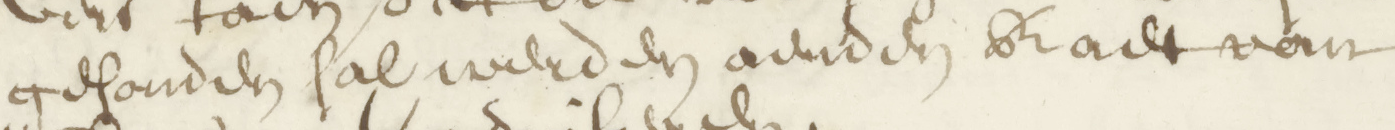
gesonden sal werden aenden Raet van
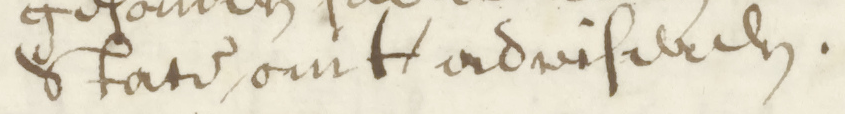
State, om t' adviseren.
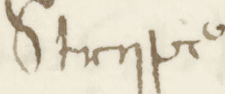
Strype
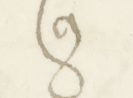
ca.
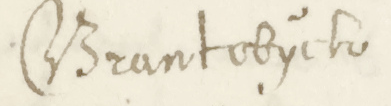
Brantwijck
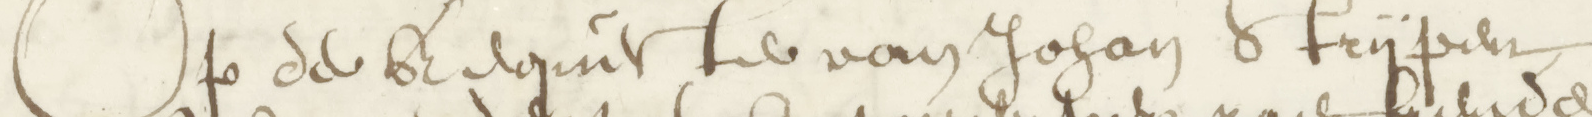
Op de Requeste van Johan Strijpen,
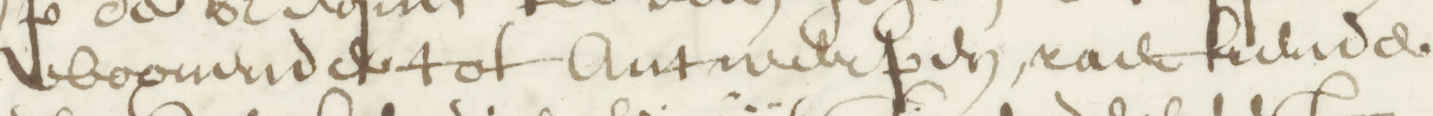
woonende tot Antwerpen, raeckende
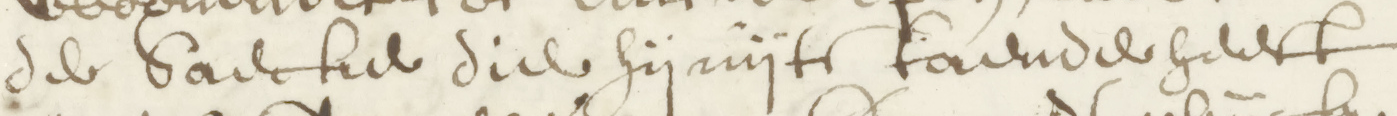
de saecke die hij uijtstaende heeft
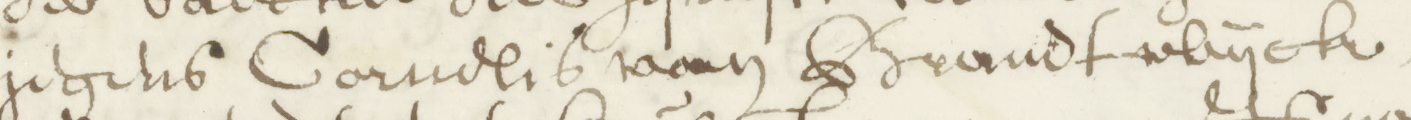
jegens Cornelis van Brandtwijck,
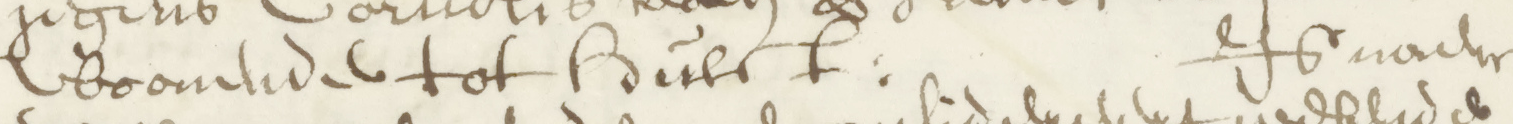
woonende tot Hulst: Is naer
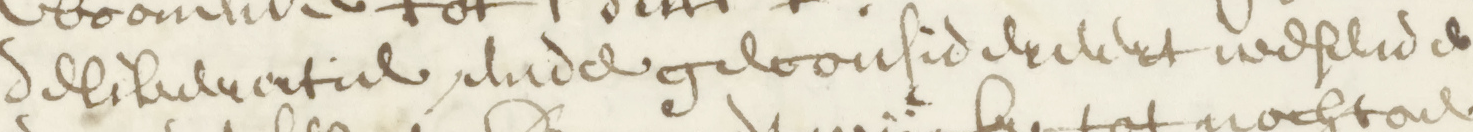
deliberatie, ende geconsidereert wesende
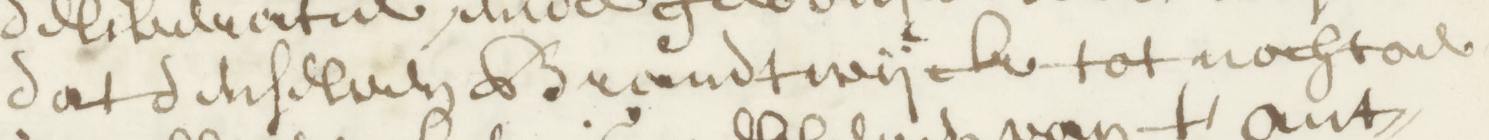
dat denselven Brandtwijck tot nochtoe
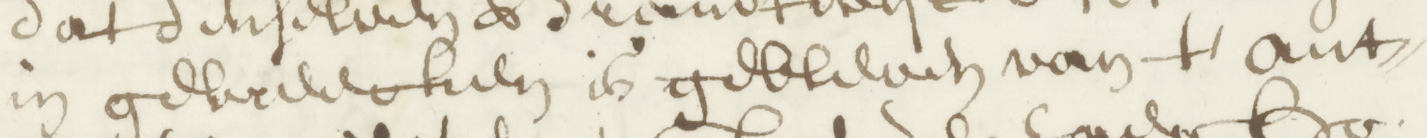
in gebreecken is gebleven van t' Ant„
